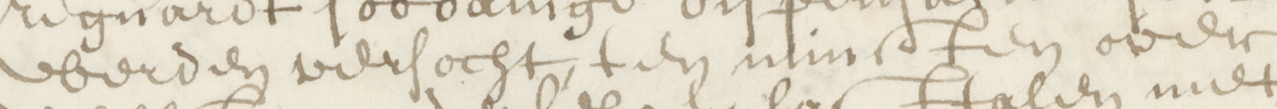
werden versocht, ten minsten over
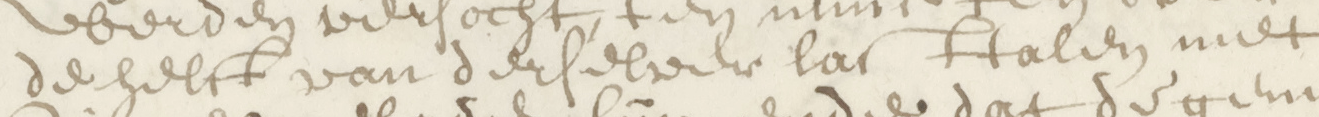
de helft van derselver lasttalen met
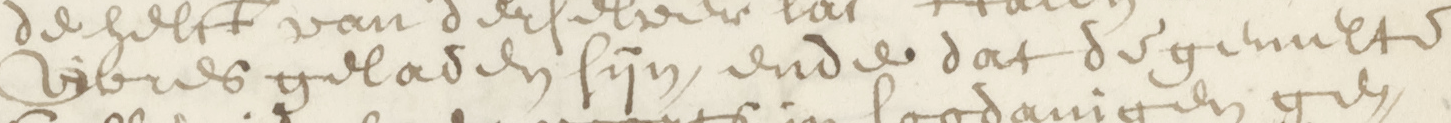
vivres geladen sijn, ende dat de gemelte
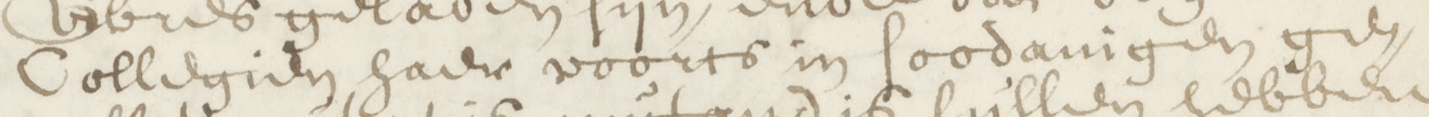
Collegien haer voorts in soodanigen ge„
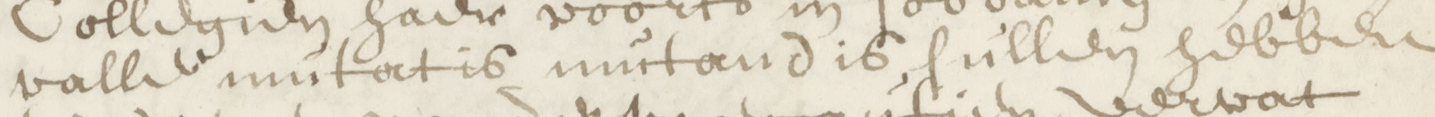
valle mutatis mutandis sullen hebben
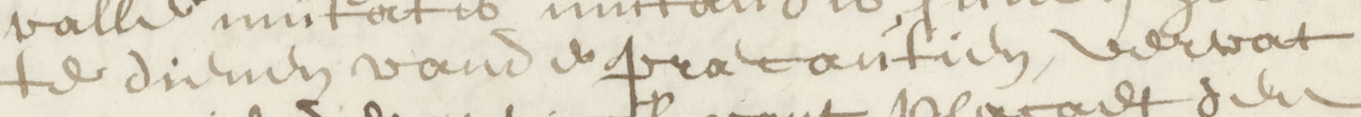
te dienen vande præcautien, vervat
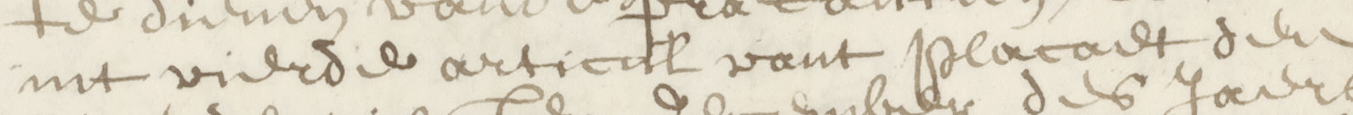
int vierde articul vant placaet den
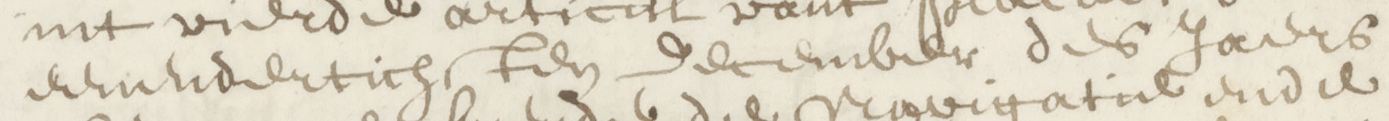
eenendertichsten December des Jaers
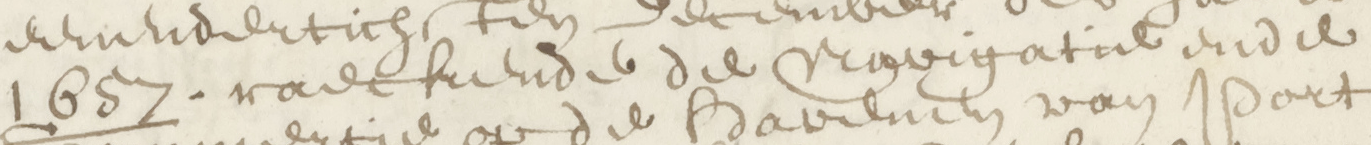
1657. raeckende de Navigatie ende
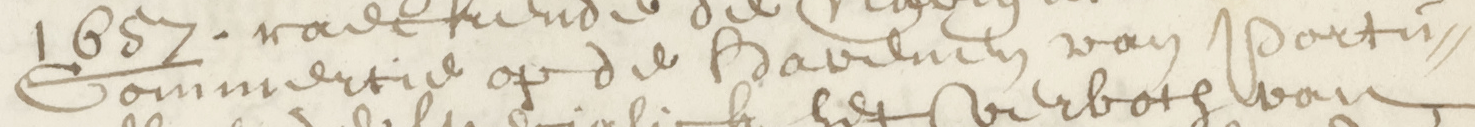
Commertie op de Havenen van Portu„
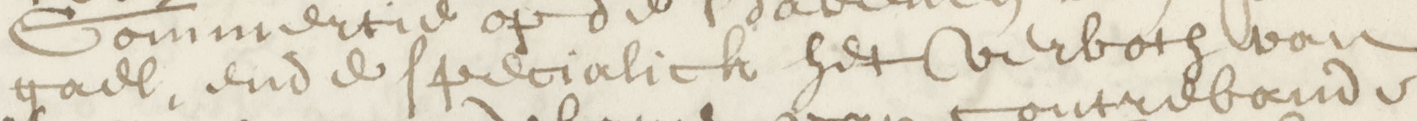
gael, ende specialick het verboth van
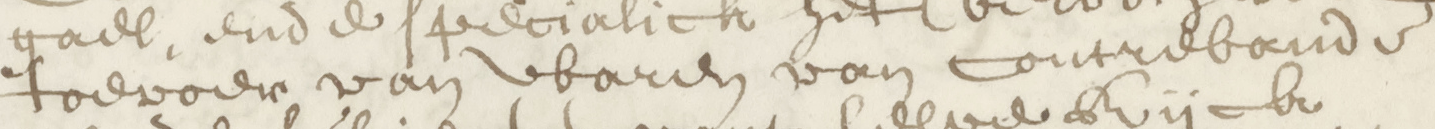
toevoer van waren van contrebande
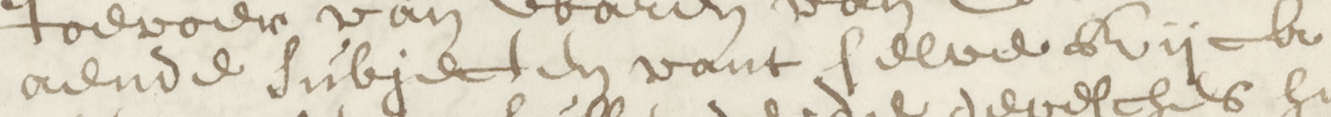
aende subjecten vant selve Rijck
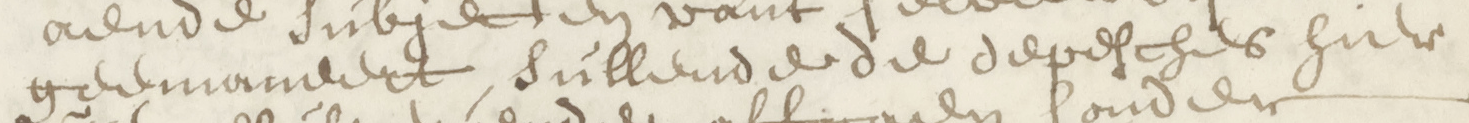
geemaneert, sullende de depesches hier
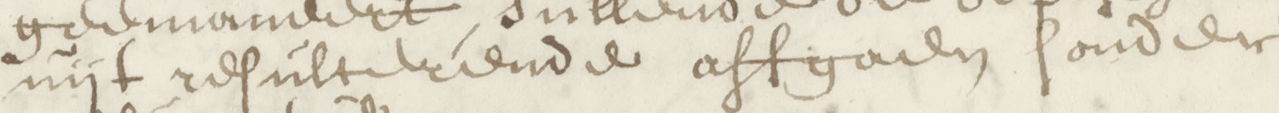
uijt resulterende affgaen sonder
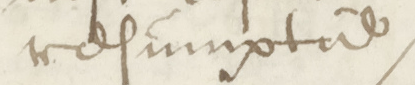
resumptie.
